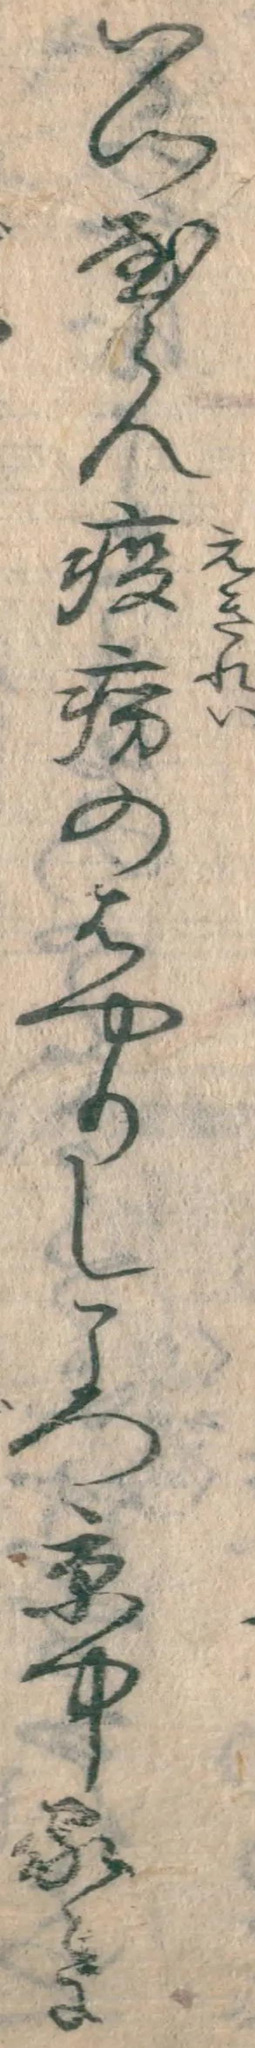いつやらん疫疠のはやりしころ京中家々に
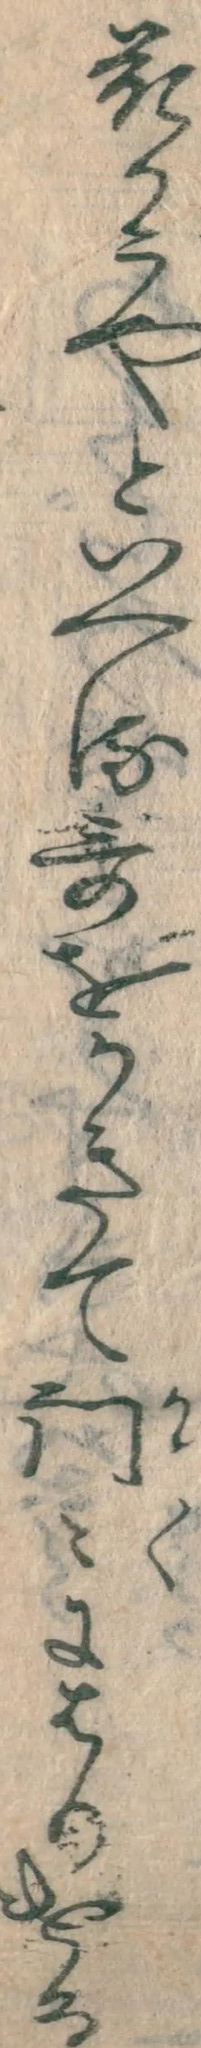花かごやといへる哥をかきて門々にはりける
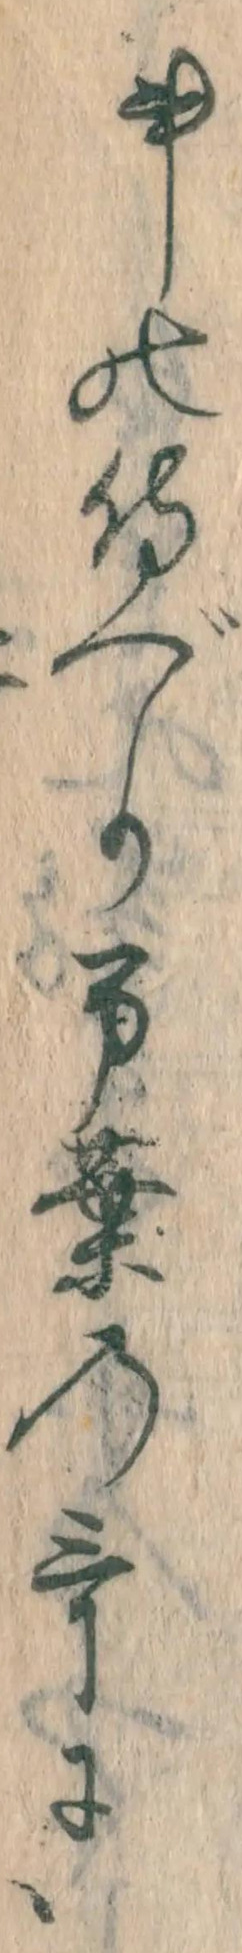事の侍べり万葉の哥に

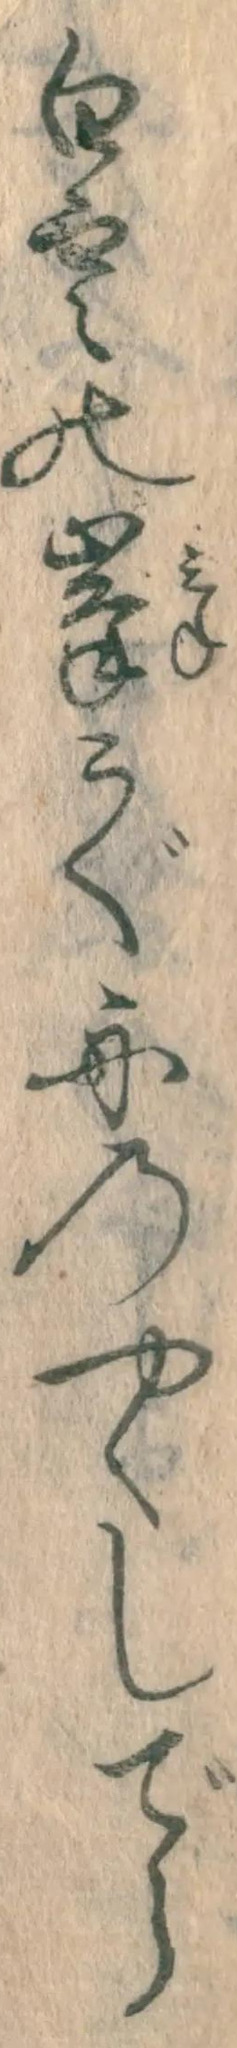白雲の峯こぐ舟のやくしでら
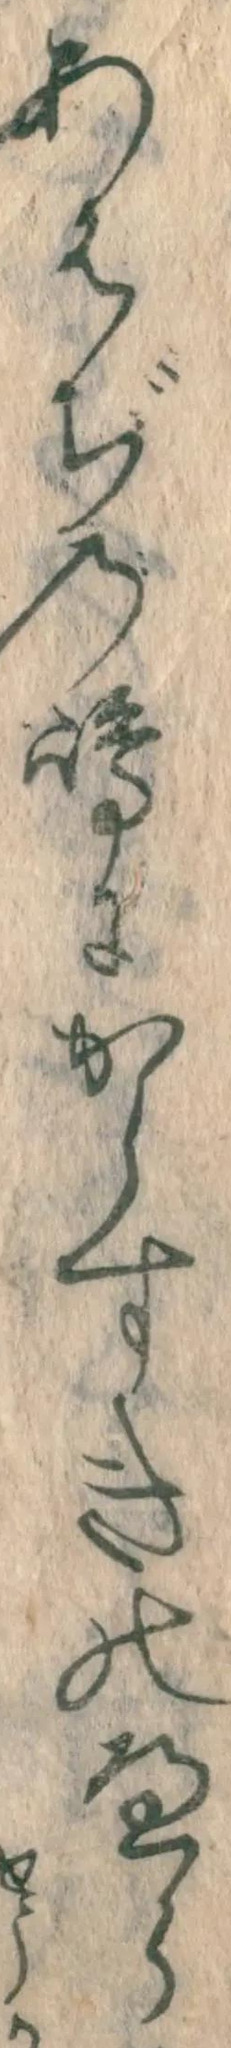あはぢの嶋にからすきのへら
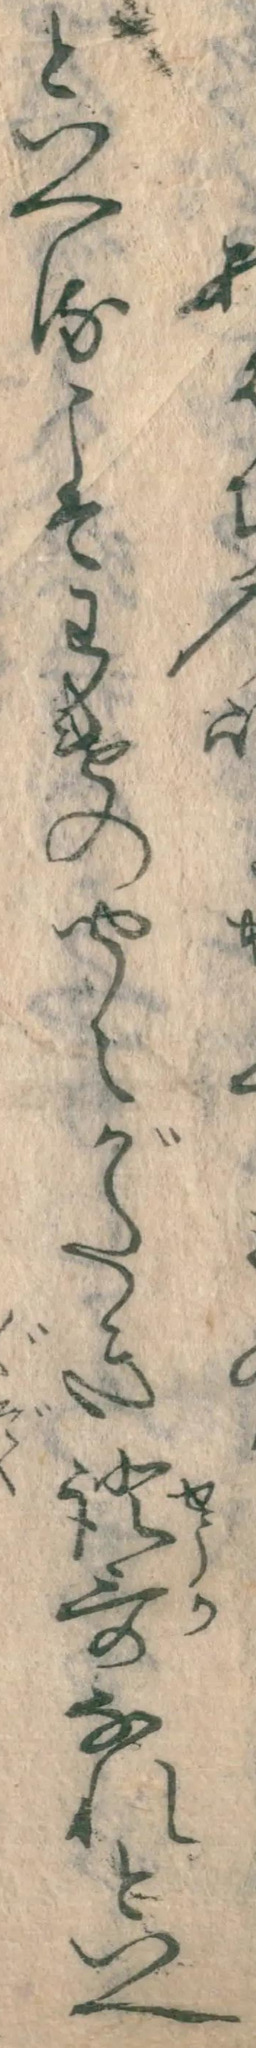といへるこそわけの聞えがたき證哥なれといへ
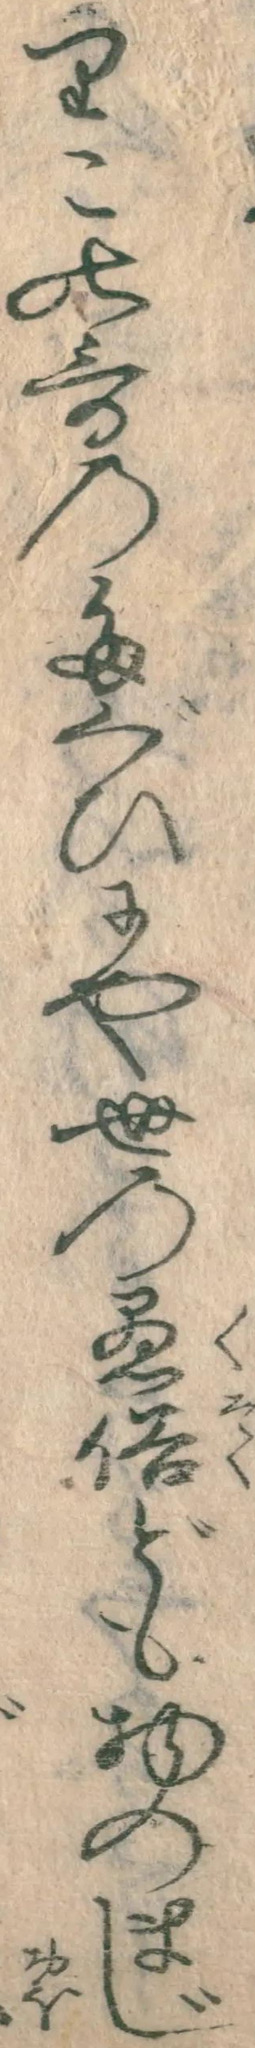りこの哥のたくひにや世の愚俗ども物のまじ
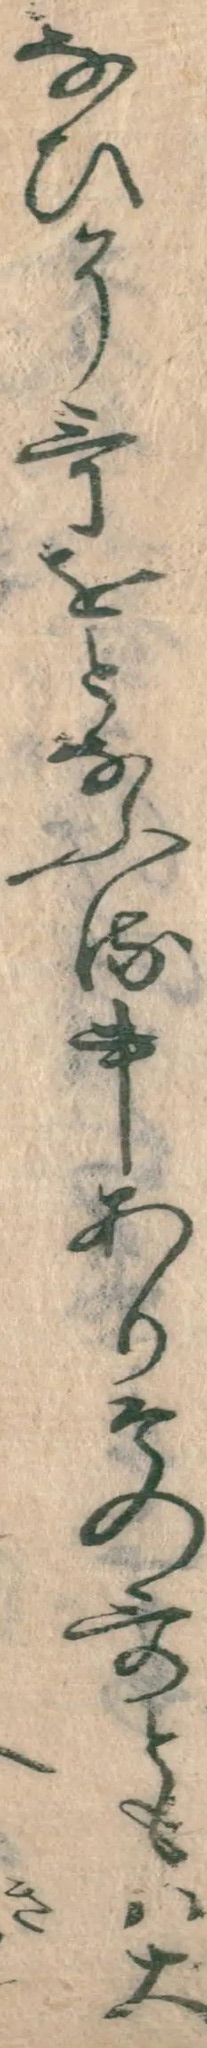なひに哥をとなふる事ありその哥どもは大
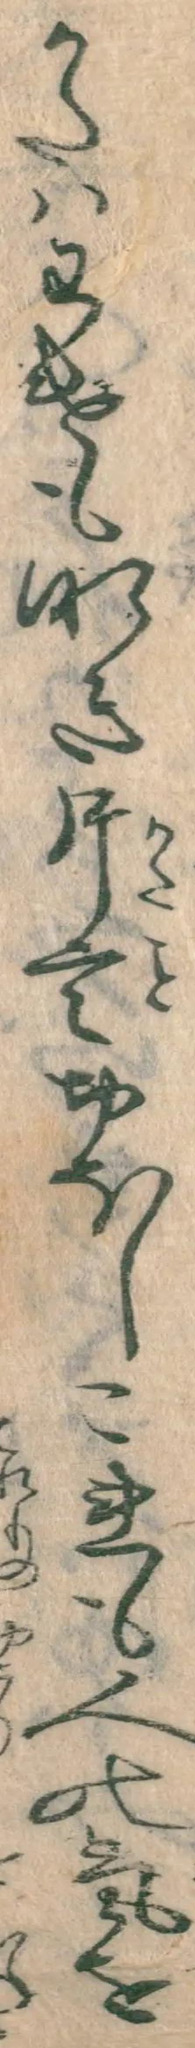かたはわけもなき片言おほしこれも人の気を
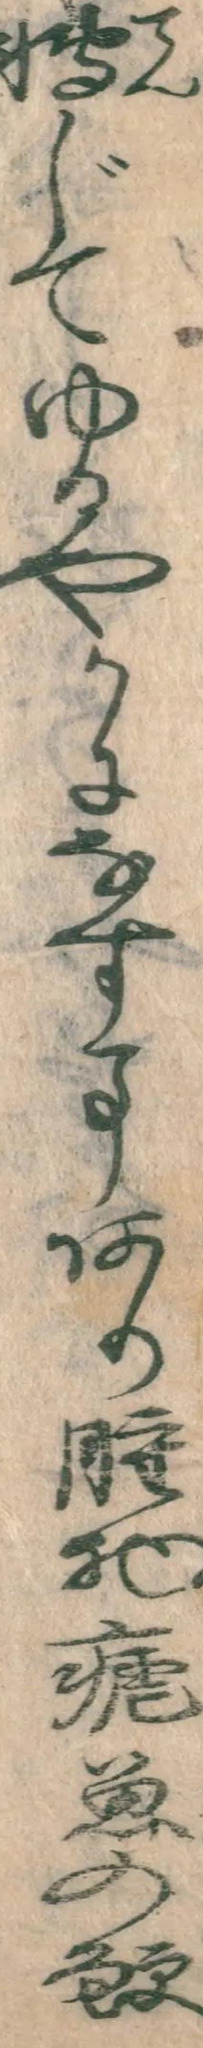転じてゆるやかになす事あり腫物瘧魚の鯁
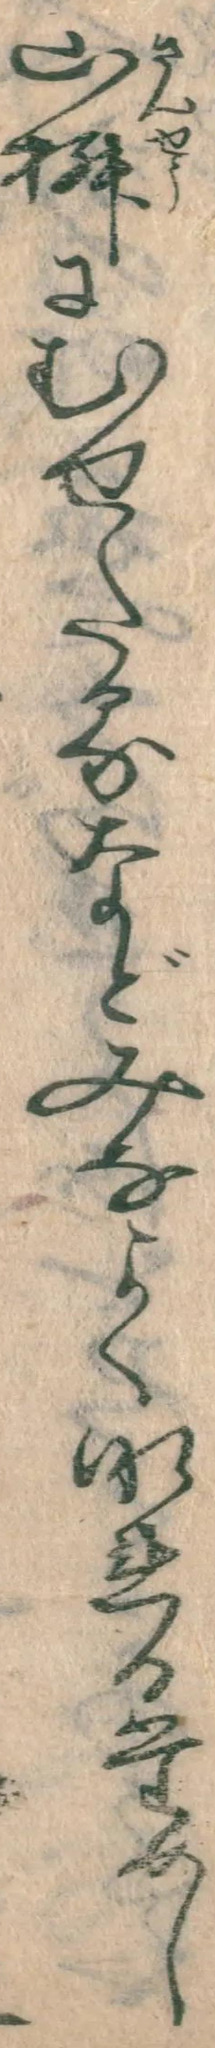山椒にむせたるなどみなよくなれるためし
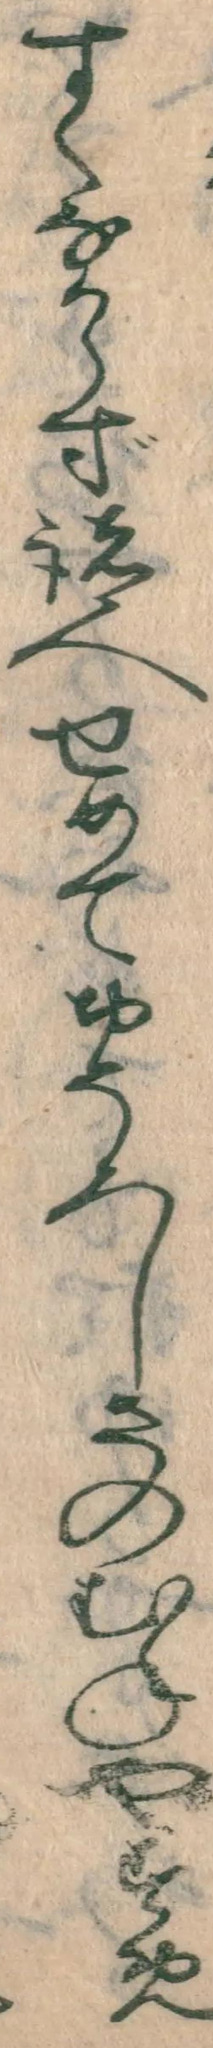すくなからず諸人せめておそろしさのむねやすめ
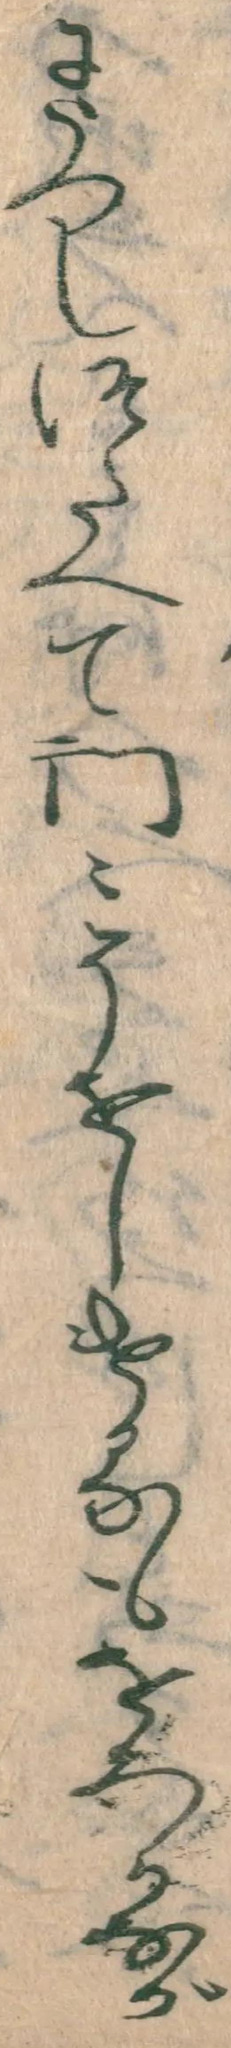にうつしつたへて門にそをしけるもをろかなが
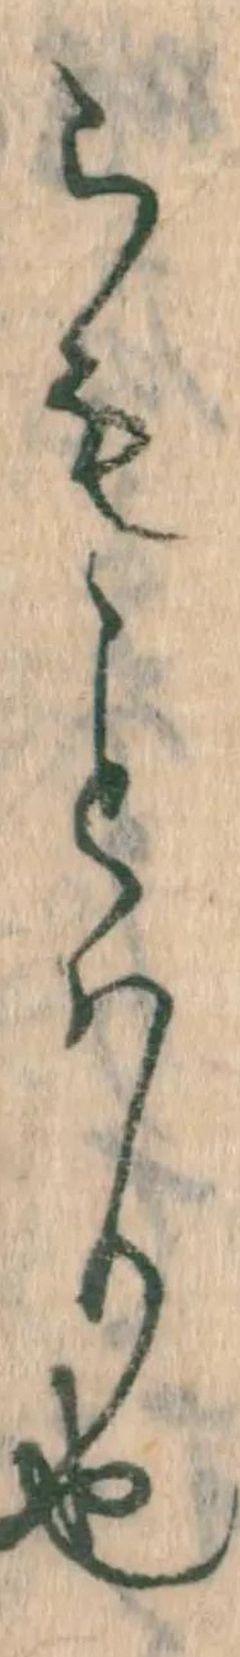らもことはり也

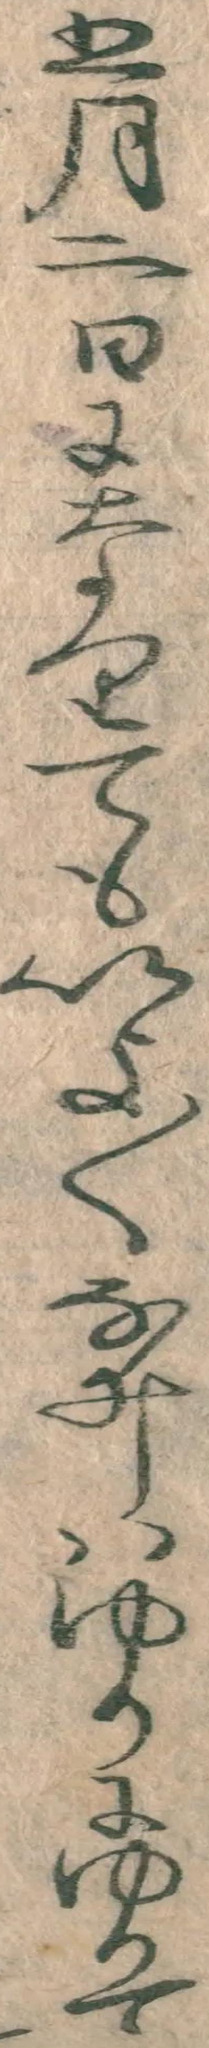五月二日になりてもいよ〳〵なゐはゆりにゆりて
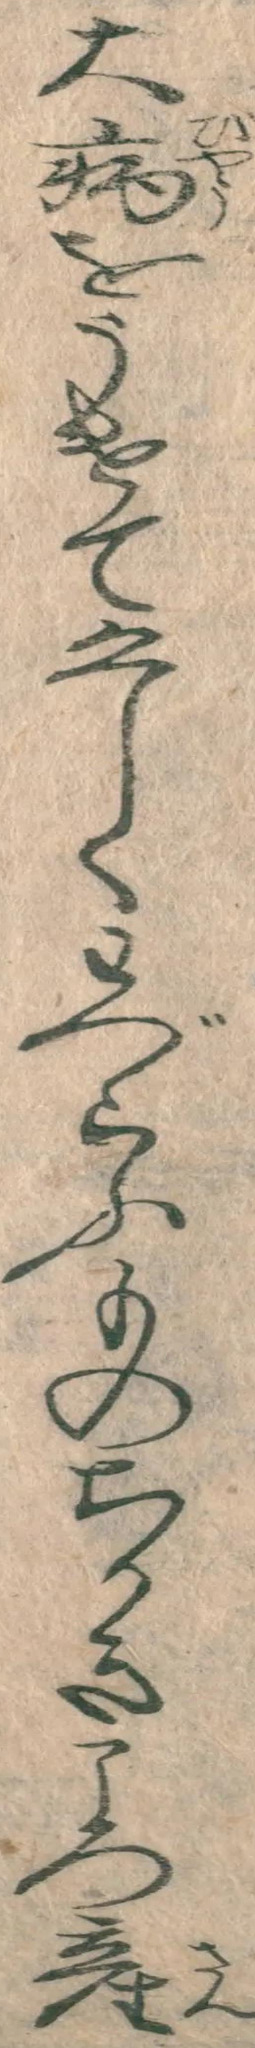大病をうけて久しくわづらふものちかきころ産
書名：艱難目異志. 上,下
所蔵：国立国会図書館 National Diet Library, JAPAN
